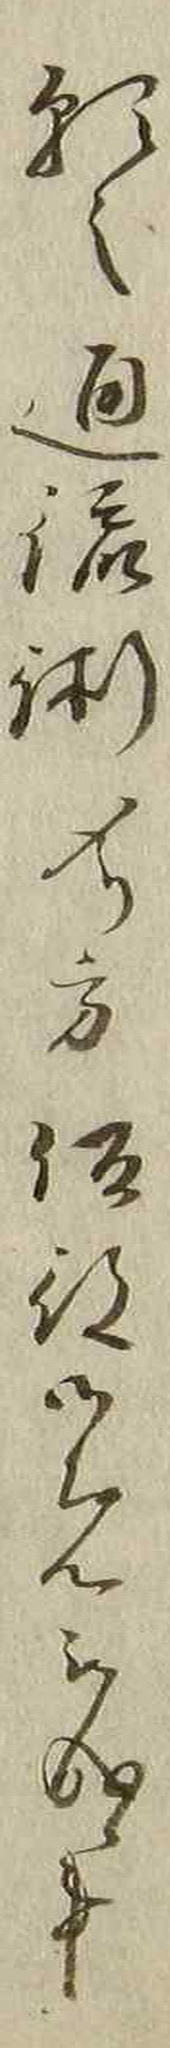願之通銃術〆り方仮役御免被成候事
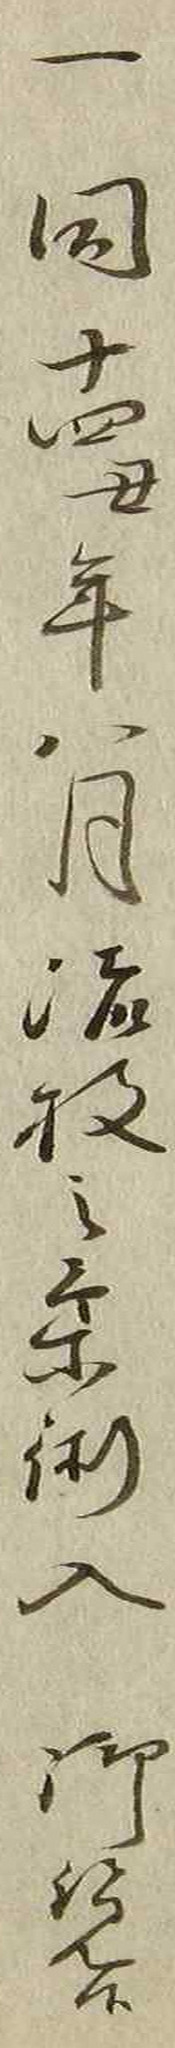一同十四丑年八月流投之柔術入御覧候
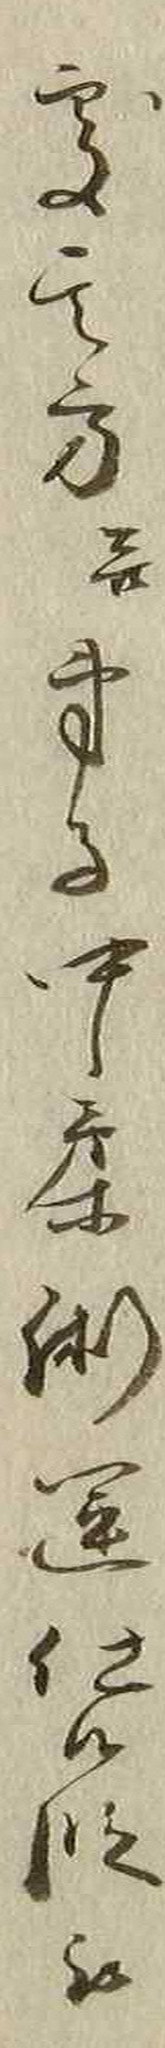処其方并弟子中柔術運仕候段被
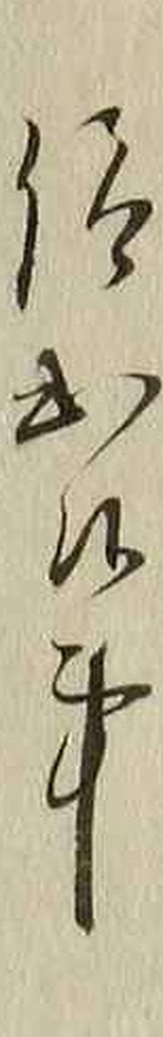仰出候事
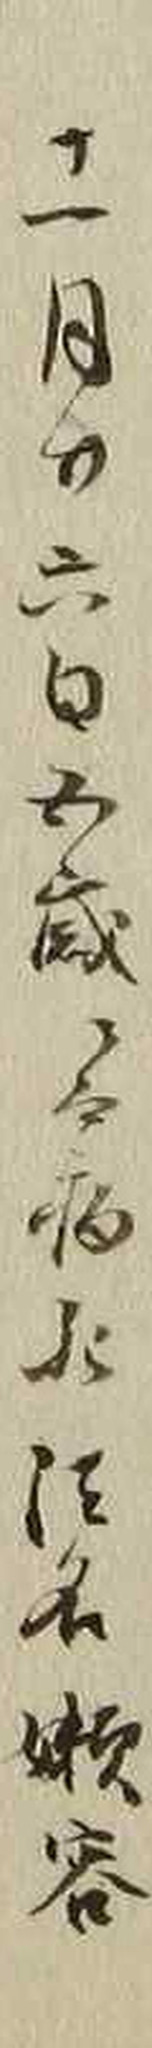十一月廿六日五歳ニ而病死法名嫩容
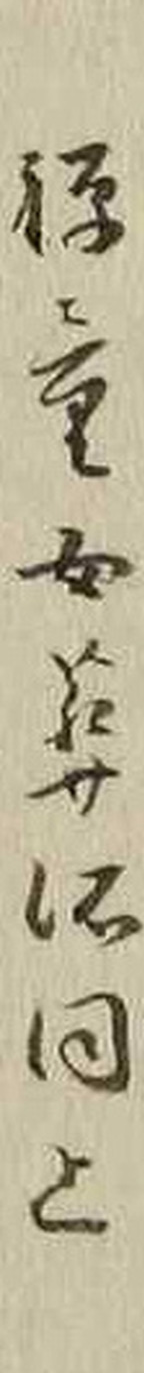禅童女葬所同上
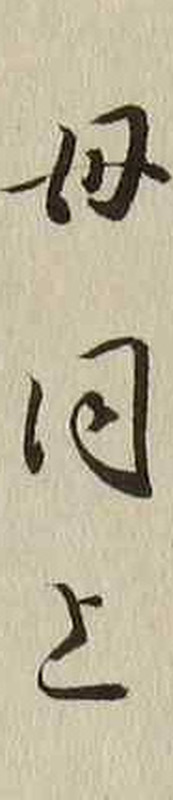母同上
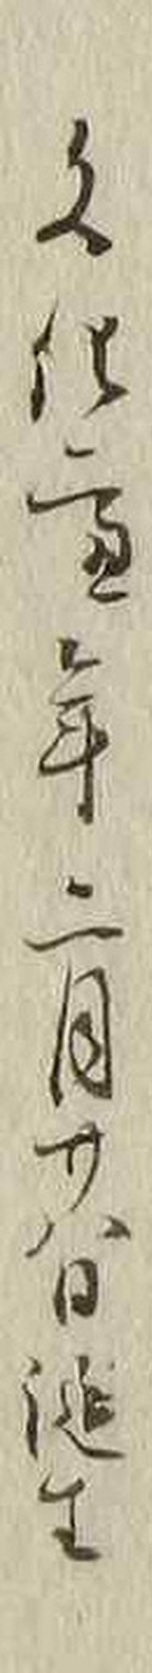文化二丑年二月廿八日誕生
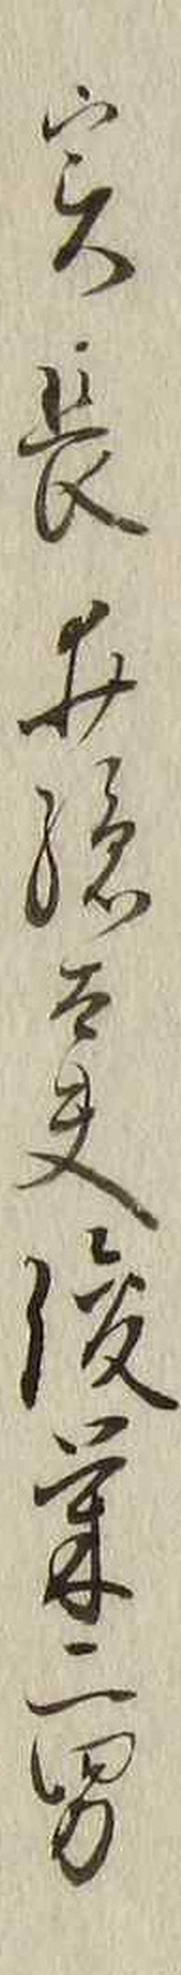実長井孫太夫俊栄二男
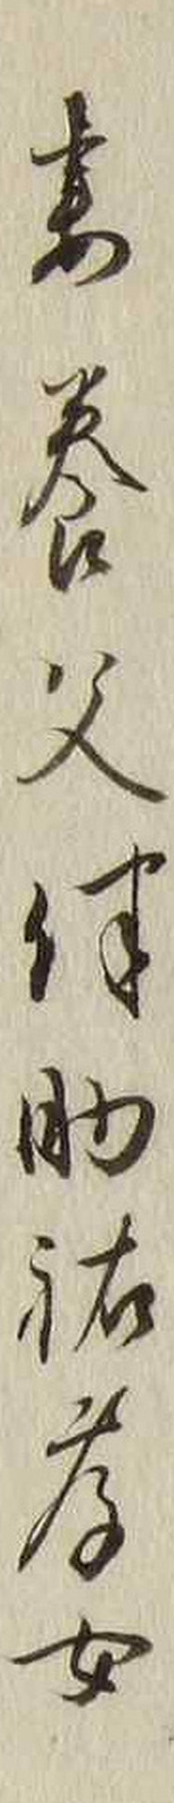妻養父伴助祐孝女
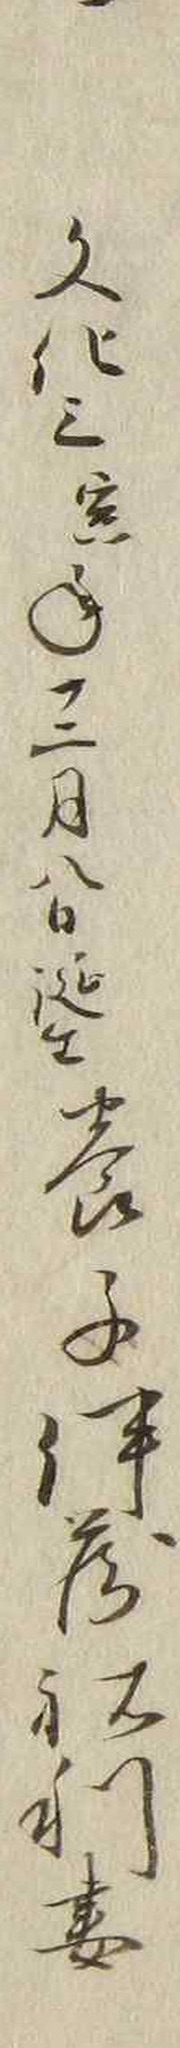文化三寅年十二月八日誕生養子伴蔵祐利妻

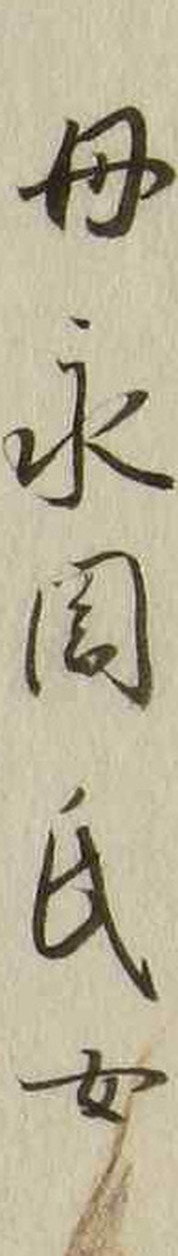母永岡氏女
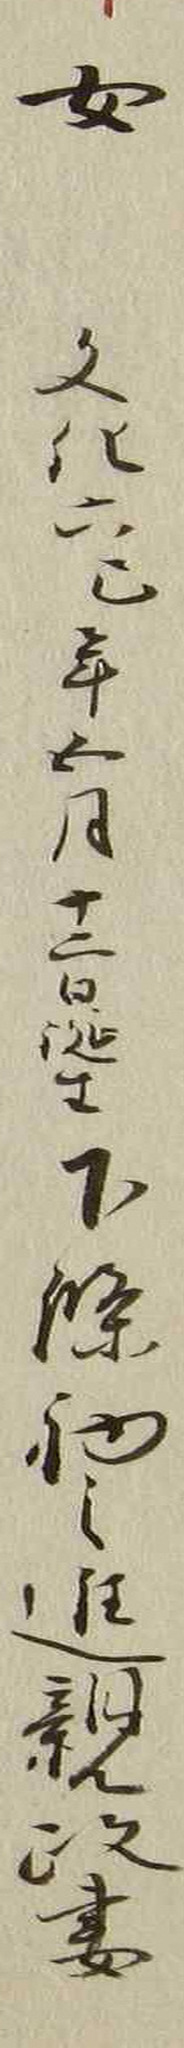文化六巳年五月十二日誕生下條初之進親政妻
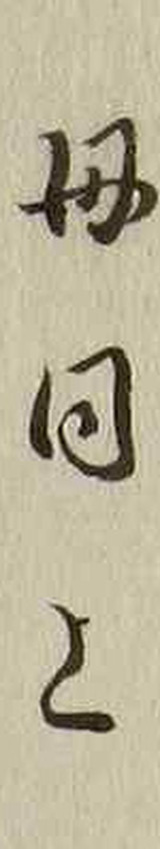母同上
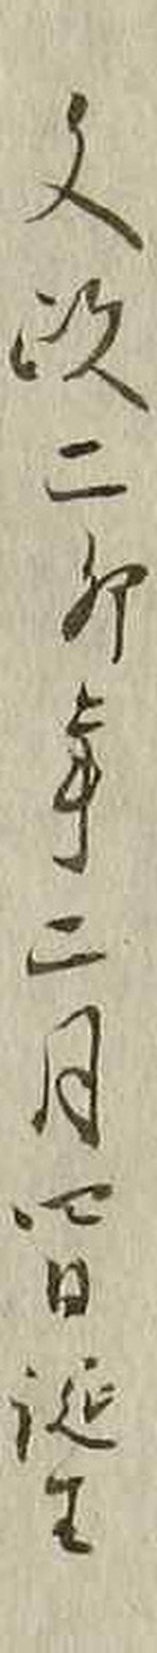文政二卯年二月四日誕生
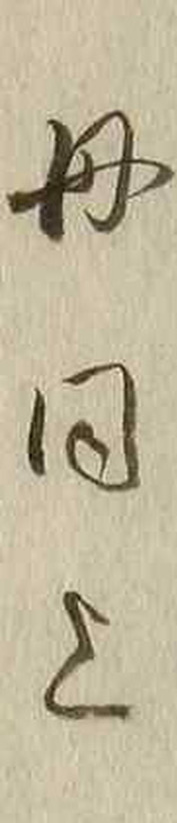母同上
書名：諸士系譜　巻之25　い之部25
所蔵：会津若松市立会津図書館
